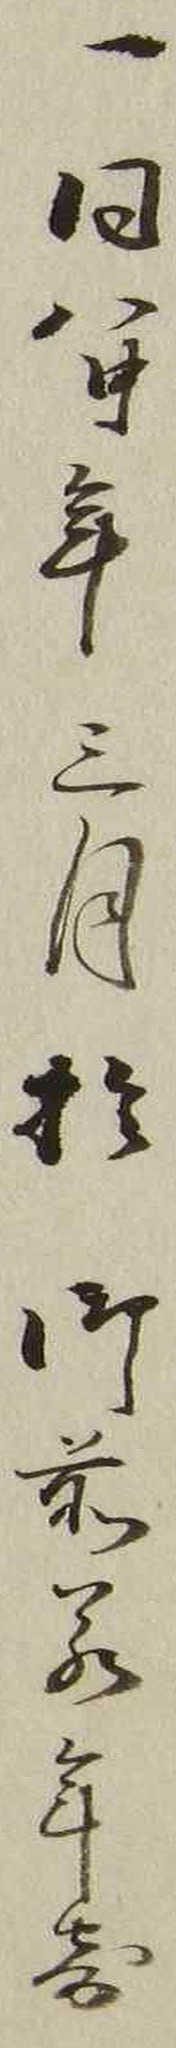一同八申年三月於御前若年寄
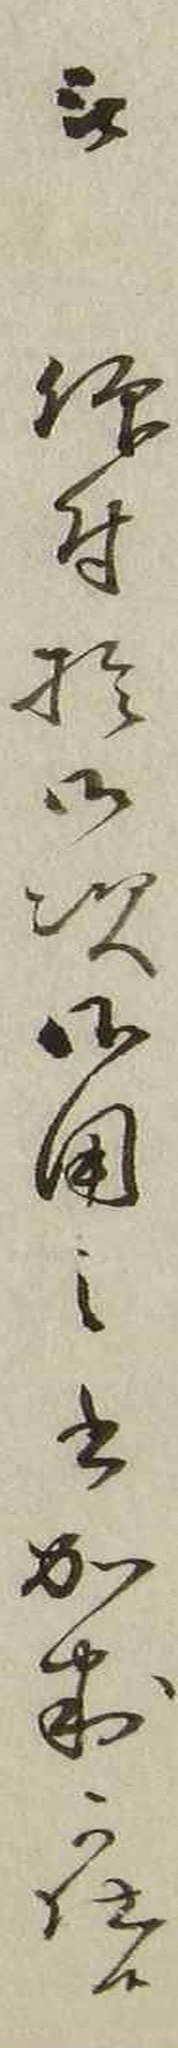被仰付於御次御用之書加判可仕候
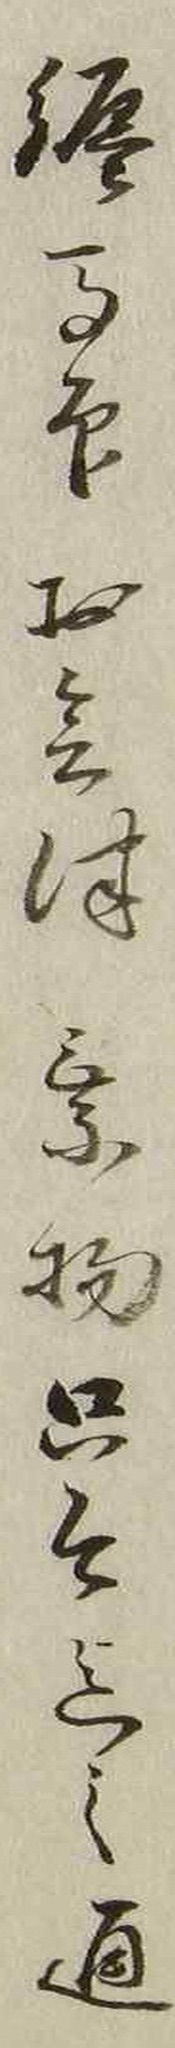纏馬印於会津乗物只今迄之通
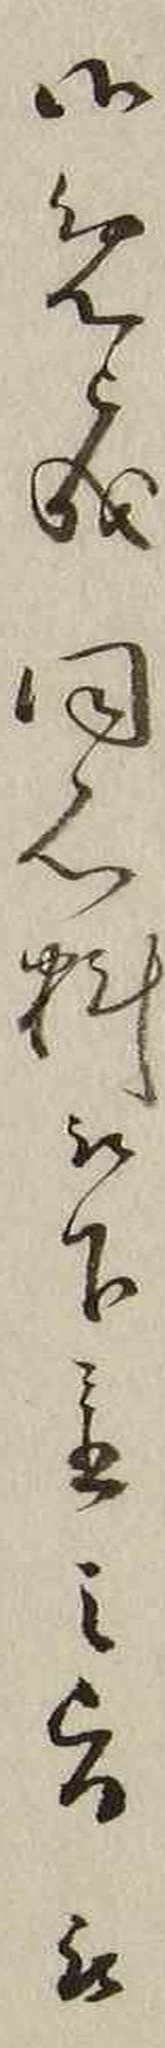御免被成同心料被下置之旨被
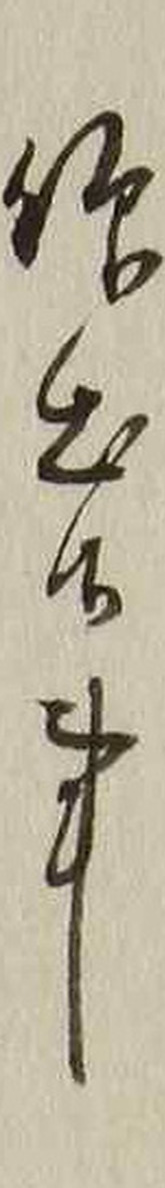仰出候事
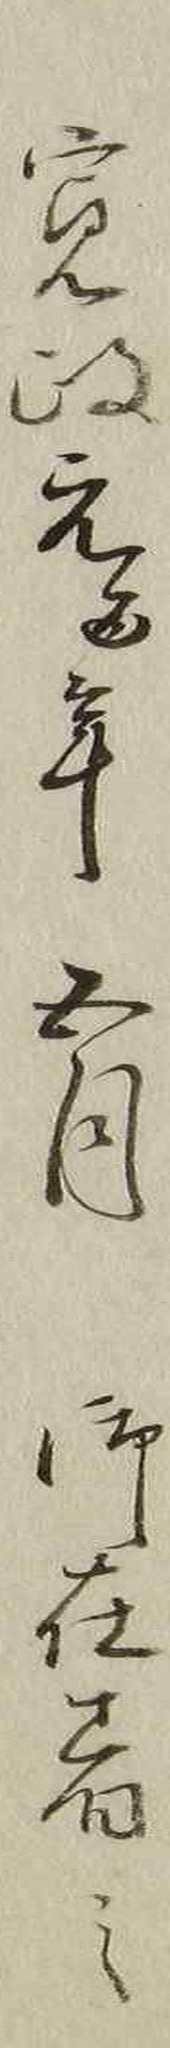一寛政元酉年五月御在着之
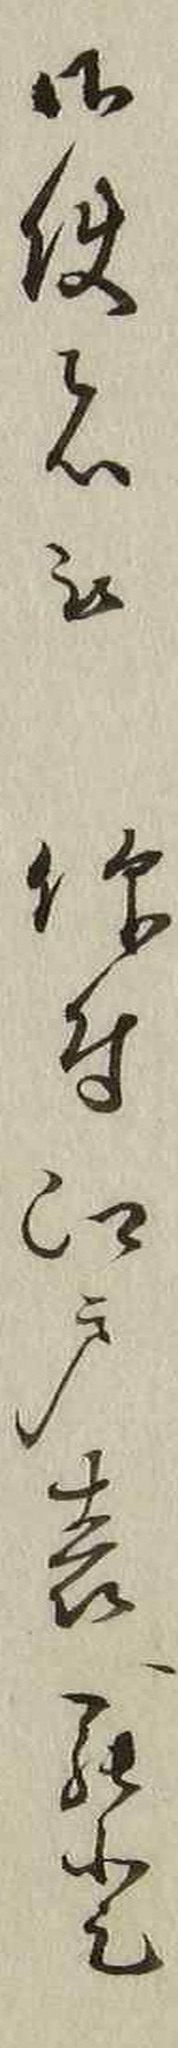御使者被仰付江戸表へ罷登
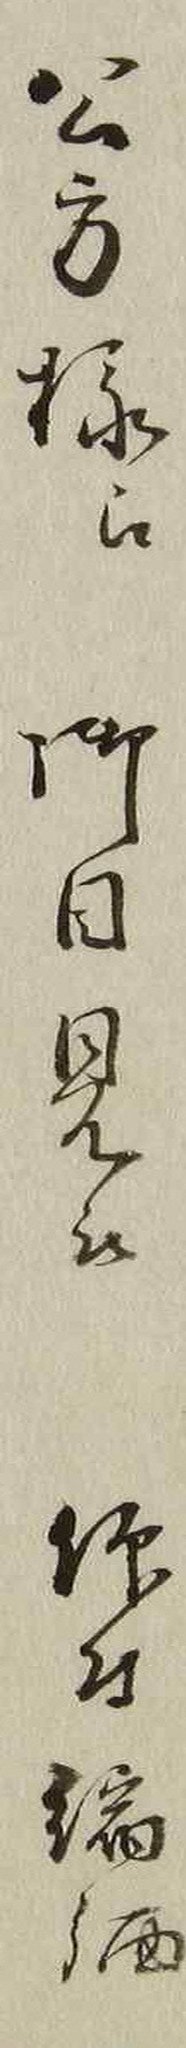公方様江被御目見被仰付縮緬
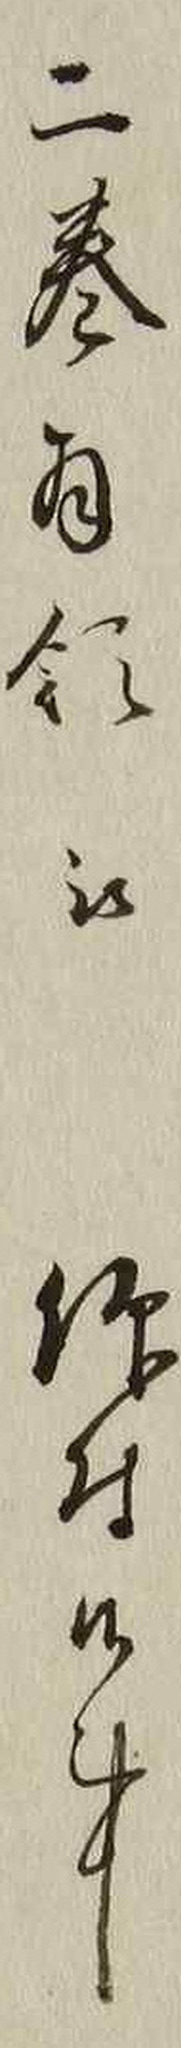二巻拝領被仰付候事
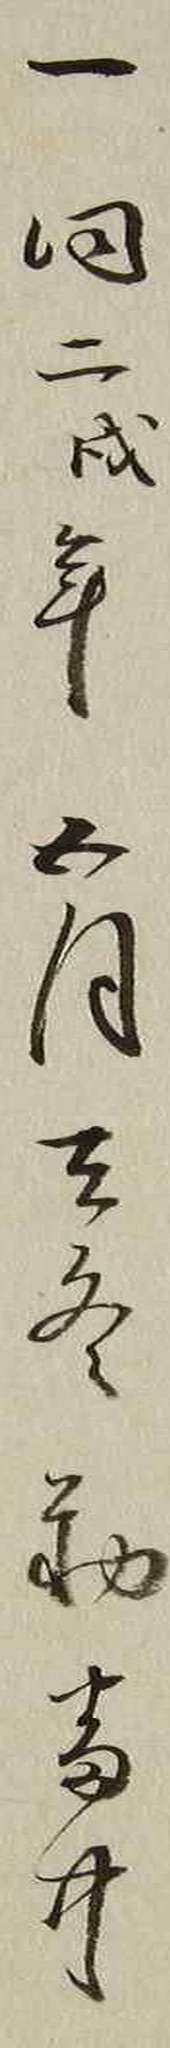一同二成年五月去冬勤番中
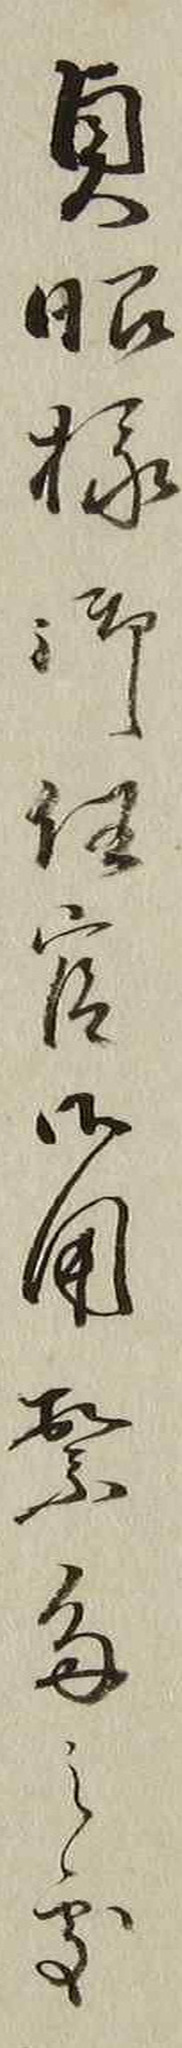貞昭様御任官御用繁多之処
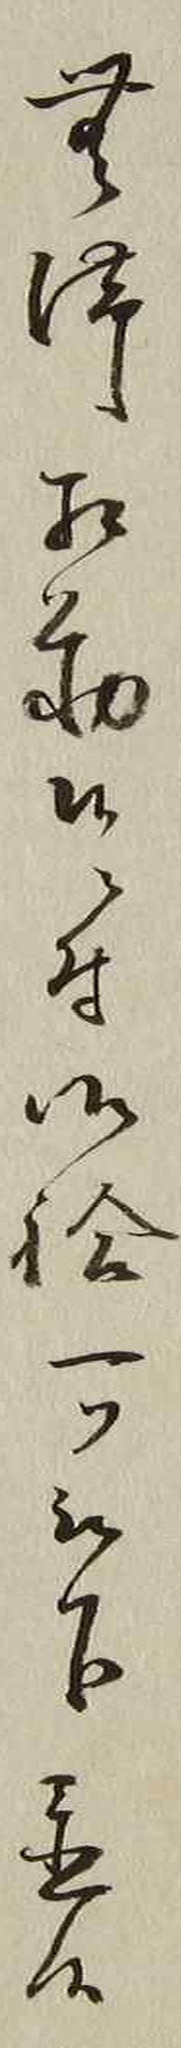無滞相勤候に付御袷一つ被下置候
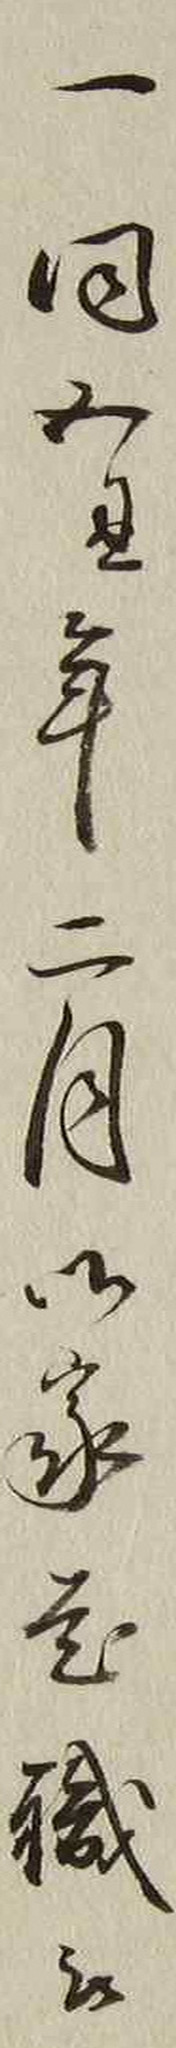一同五丑年二月御家老職被
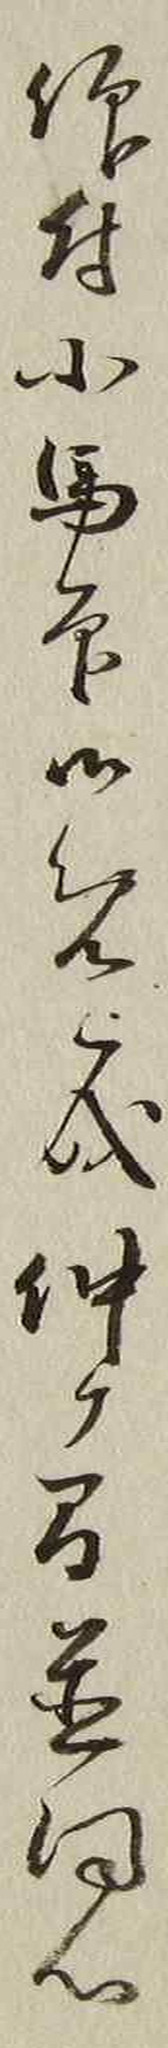仰付小馬印御免被成仲ケ間並同心
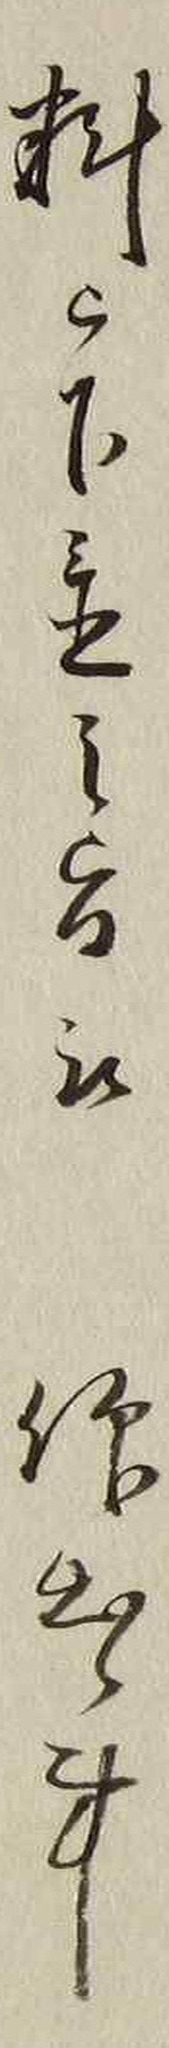料被下置之旨被仰出候事
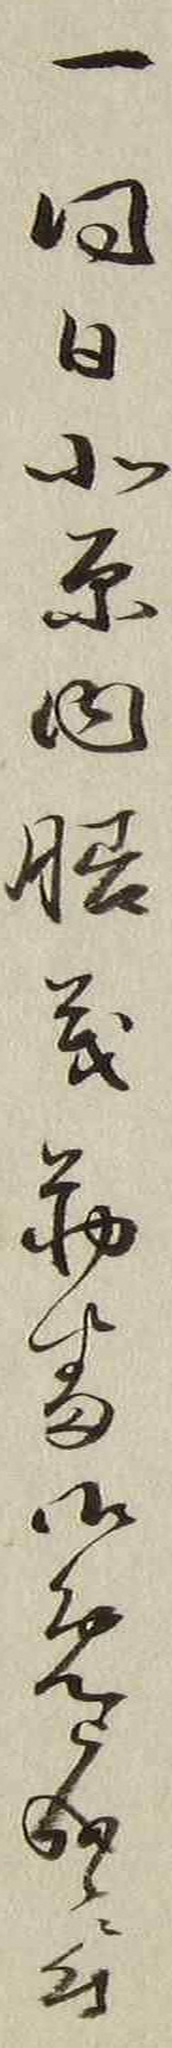一同日北原内膳義勤番御免被成候に付
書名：諸士系譜　巻之159　な之部1
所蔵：会津若松市立会津図書館
